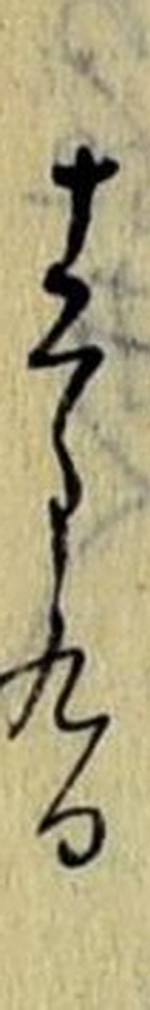十二月九日
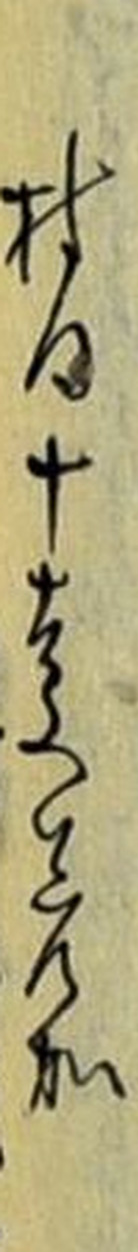村田十太夫差加
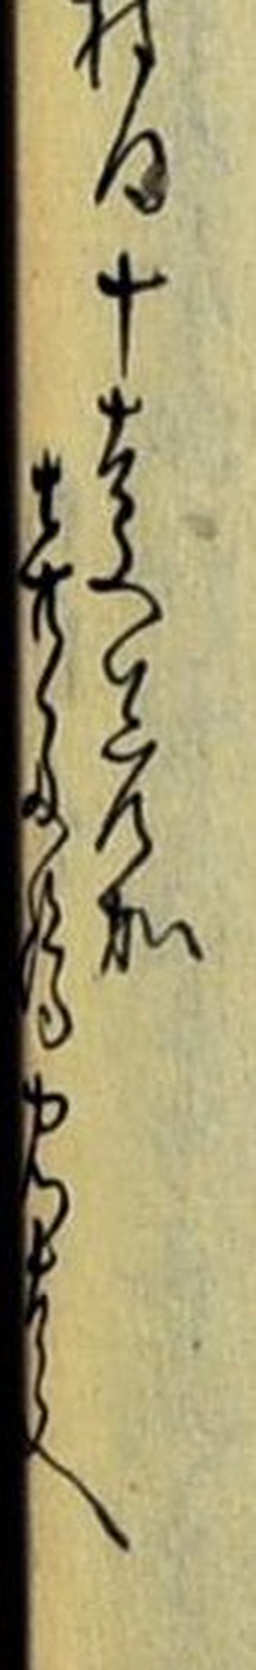村田十太夫差加
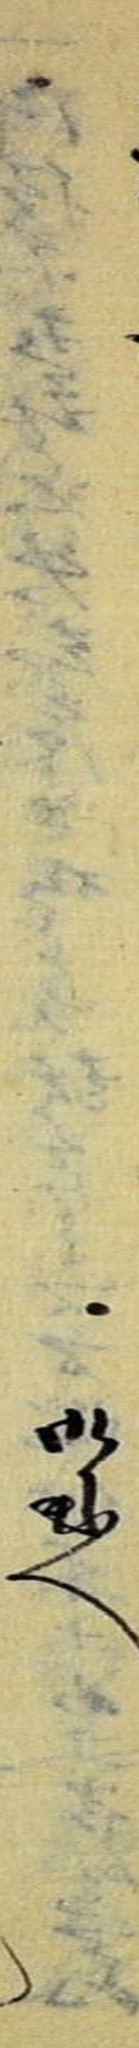御用人
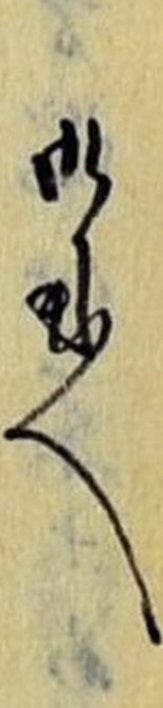御用人
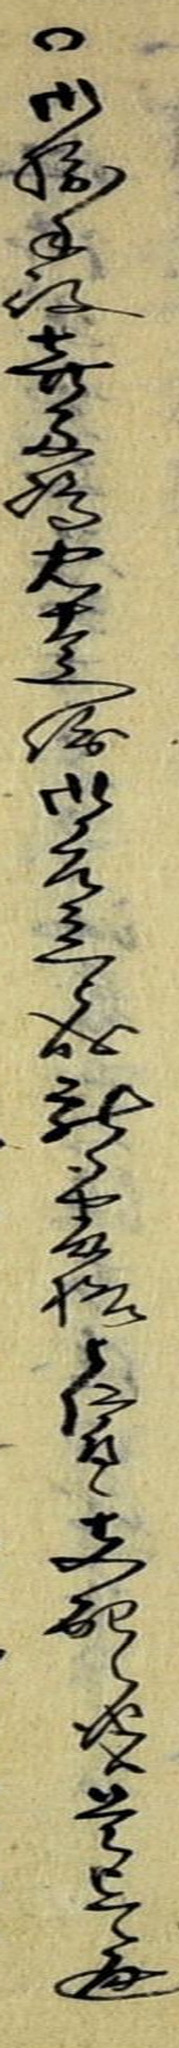○御勝手役喜多嶋忠太夫儀御取立被成新番格被仰付候支配之儀は是迄之通
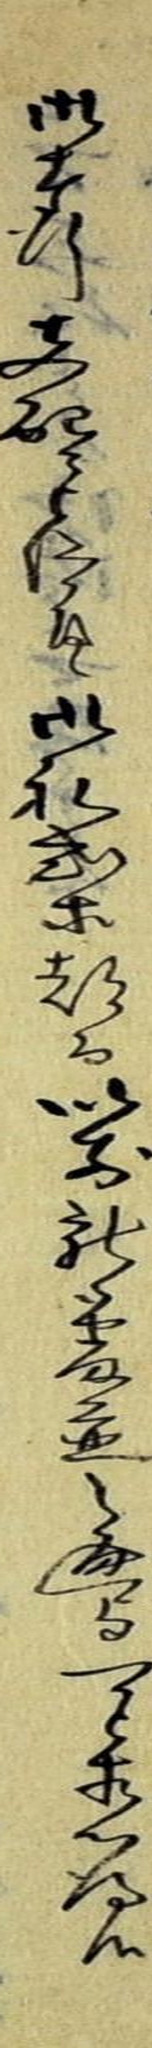御奉行支配被仰付候御礼式等都而以前新番並之通と可被相心得候
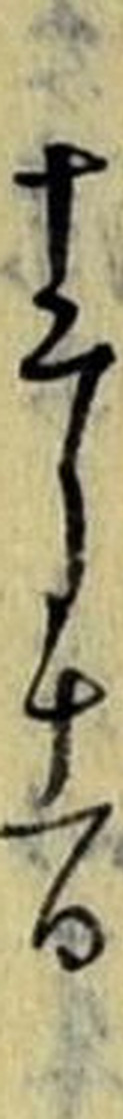十二月十一日
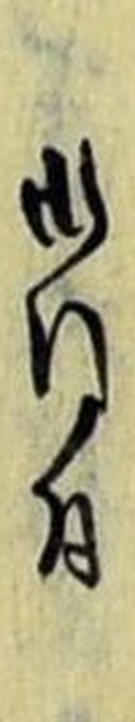御目付
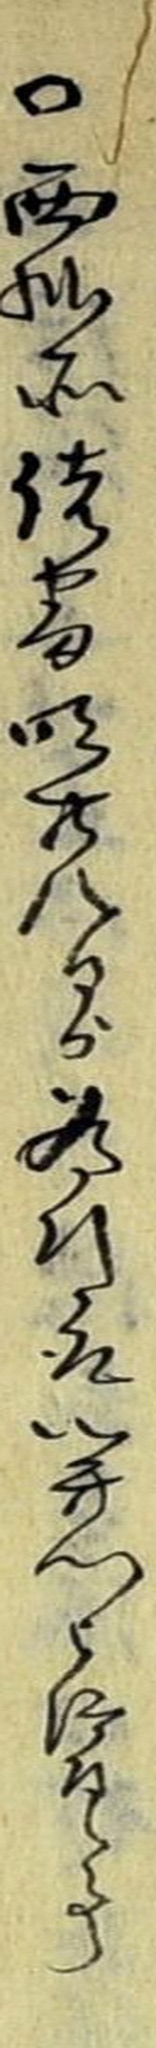○西掛所詰番明廿八日ゟ為引取開門被仰付候事
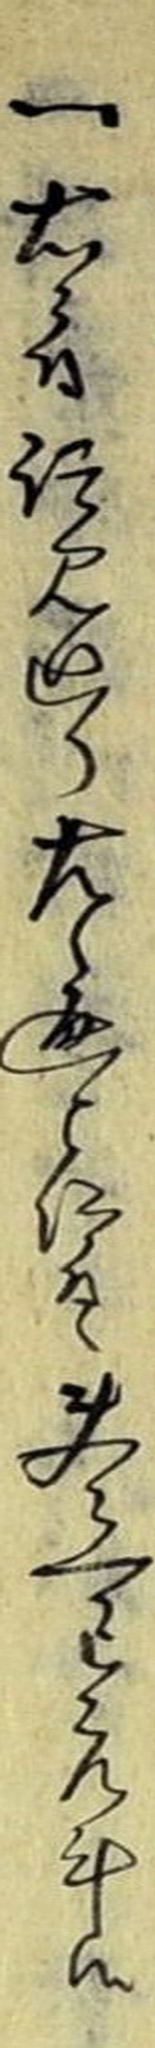一右に付跡見廻り左之通被仰付候夫々可被取斗候
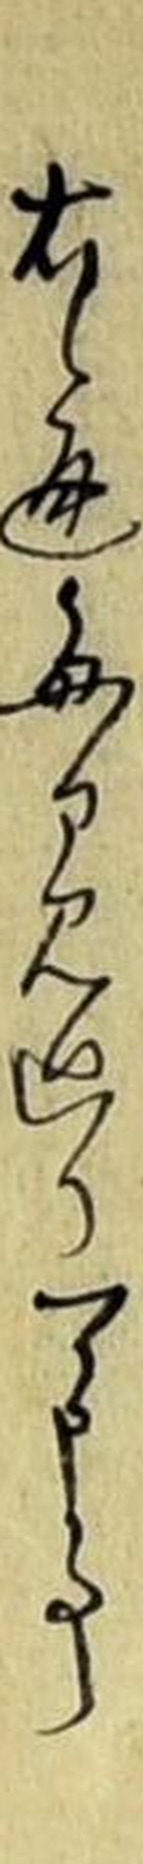右之通毎日見廻り可申事
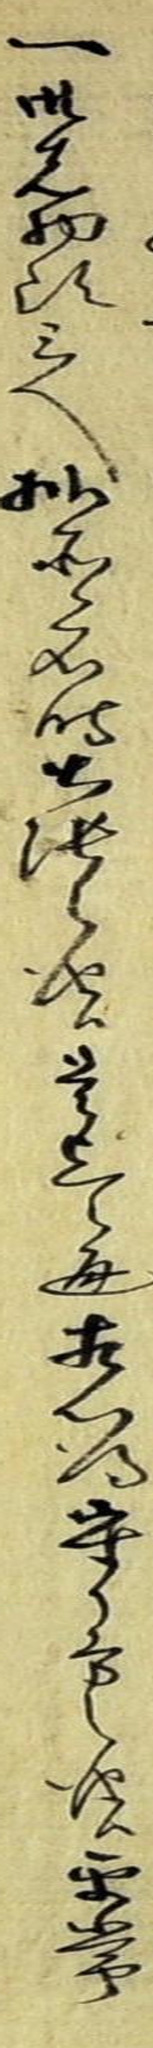一御先物頭三人掛所へ不時出張之儀は是迄之通相心得守り方之儀は平常
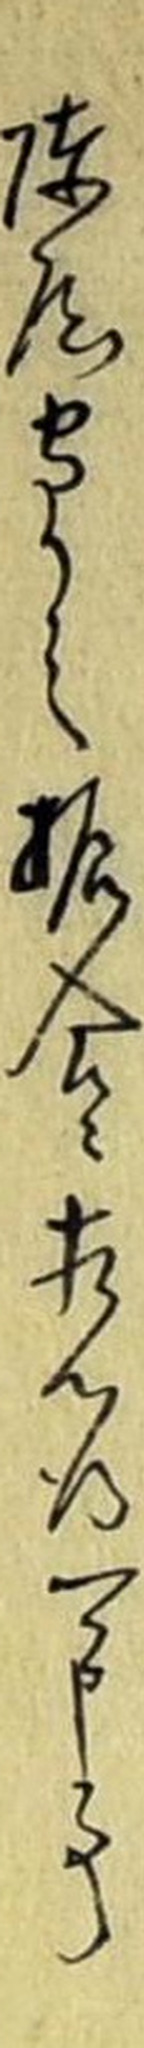陣屋守り之振合に相心得可申事
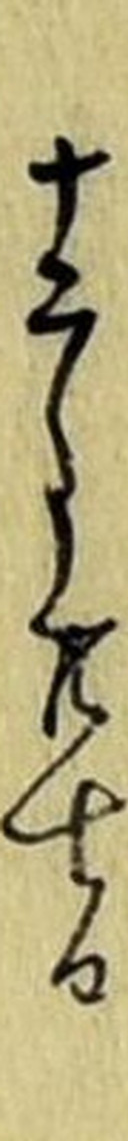十二月廿七日
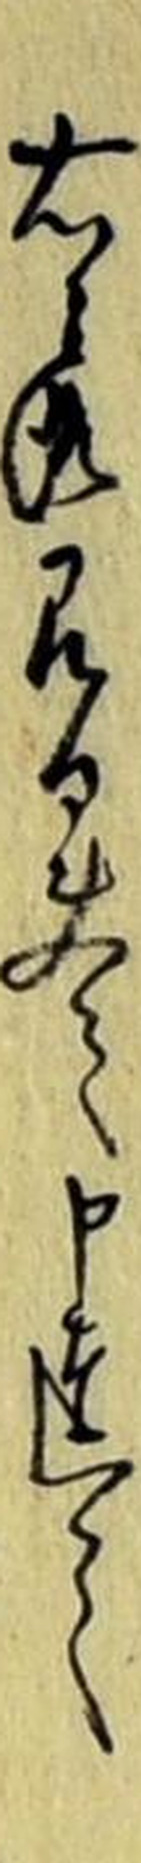右之趣即日夫々申達之
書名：命令之部 四
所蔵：福井県文書館 Fukui Prefectural Archives
